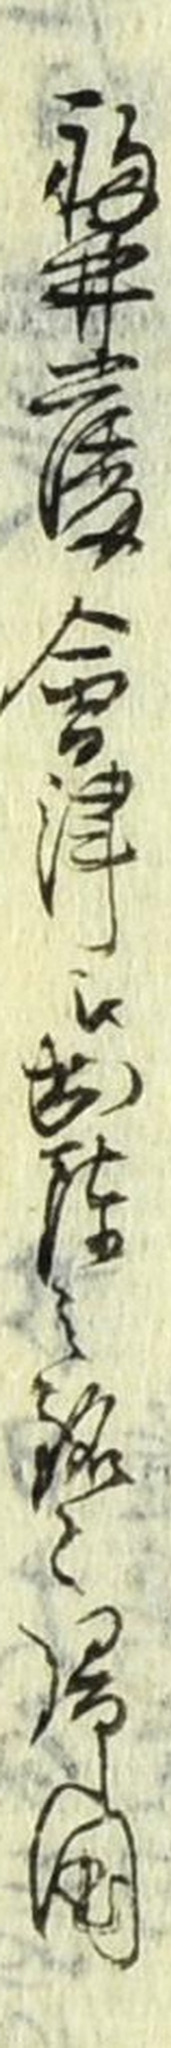福井藩会津え出陣之銘々帰国
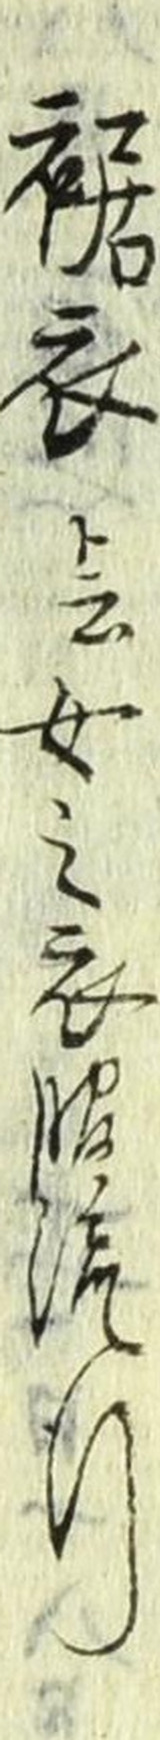裾衣と云女之衣服流行
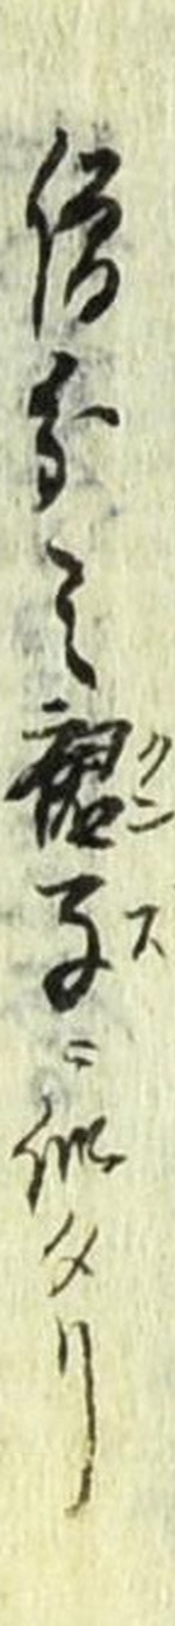僧分之裙子に似たり

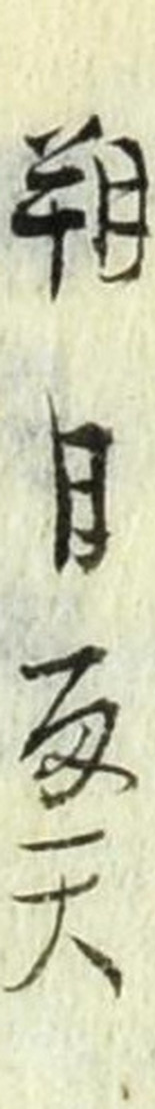七日雨天
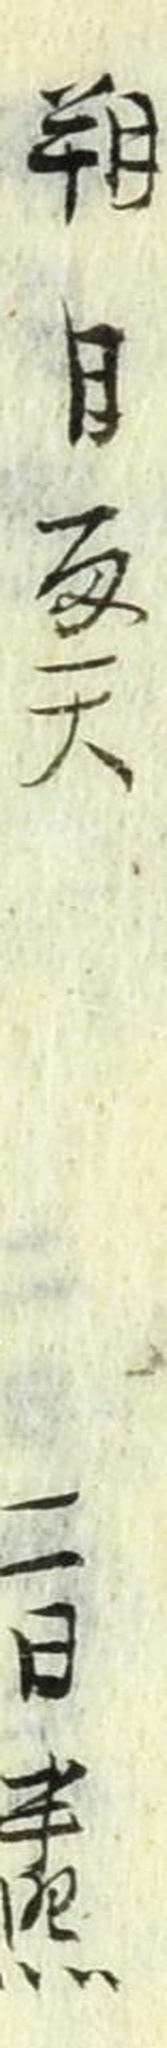朔日雨天二日半照
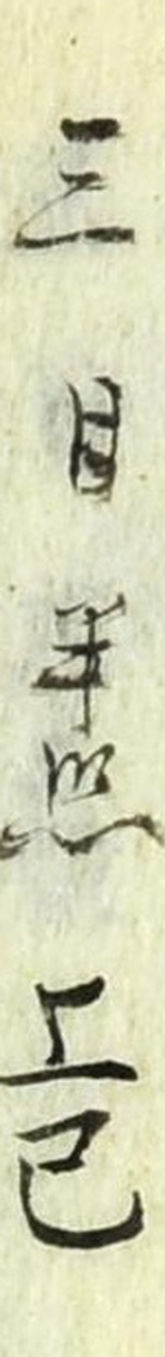三日半照上巳
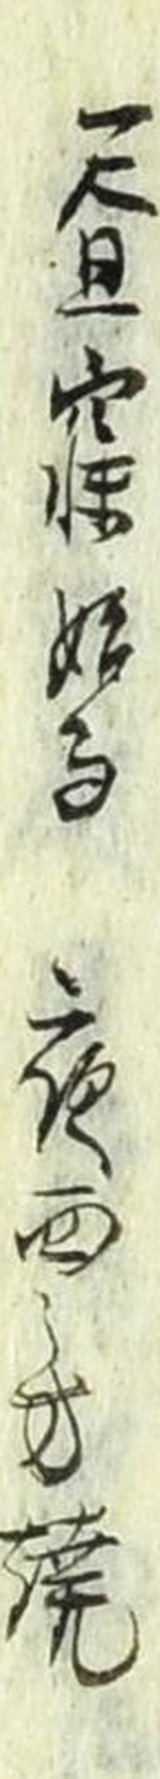昼寝始る夜西之方焼
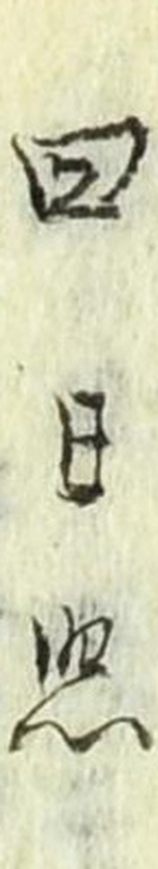四日照
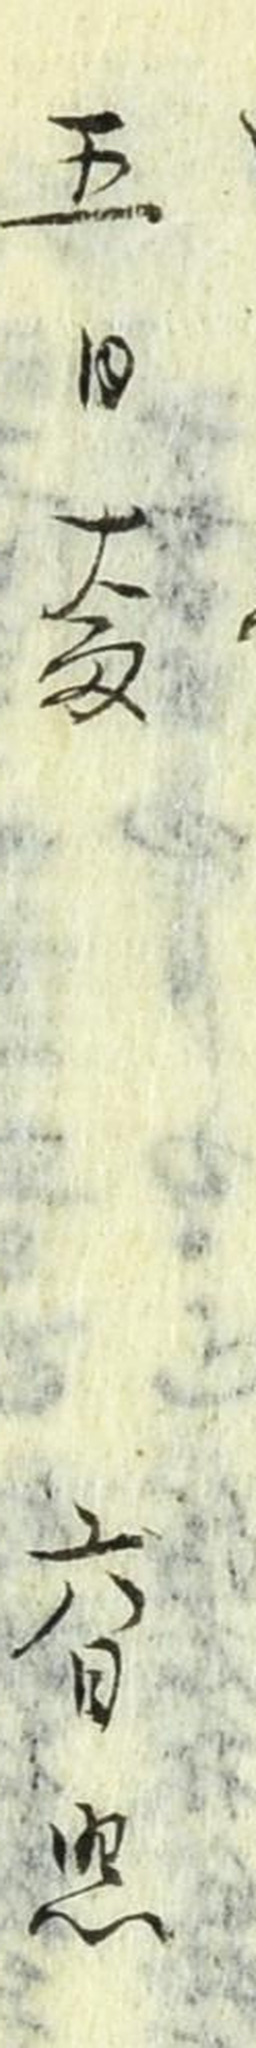五日大雨六日照
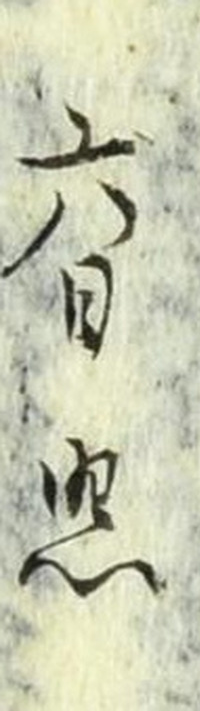四日照
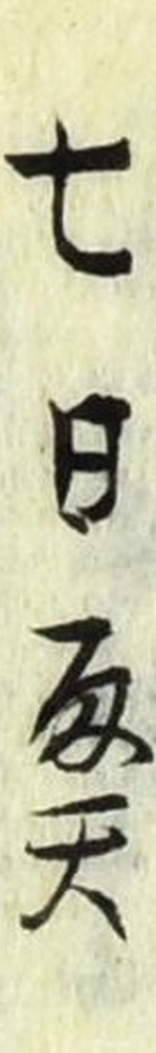七日雨天
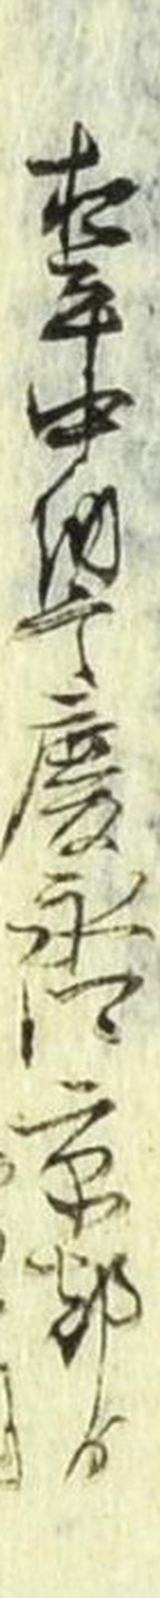松平中納言慶永卿京都ゟ御帰国
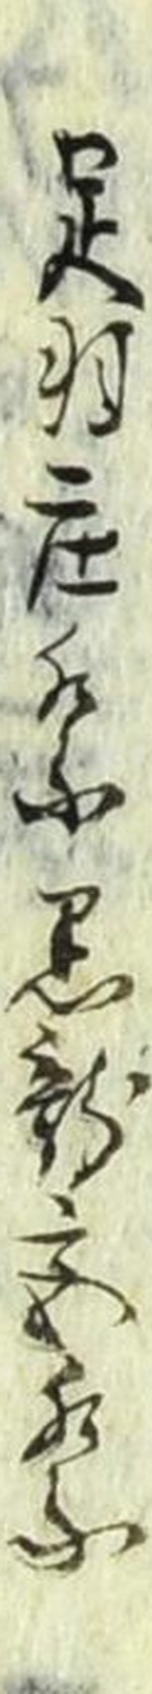足羽庄祭黒新宮祭
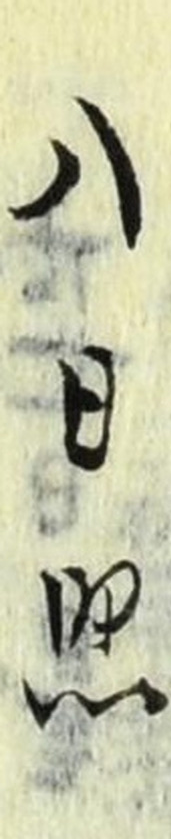四日照
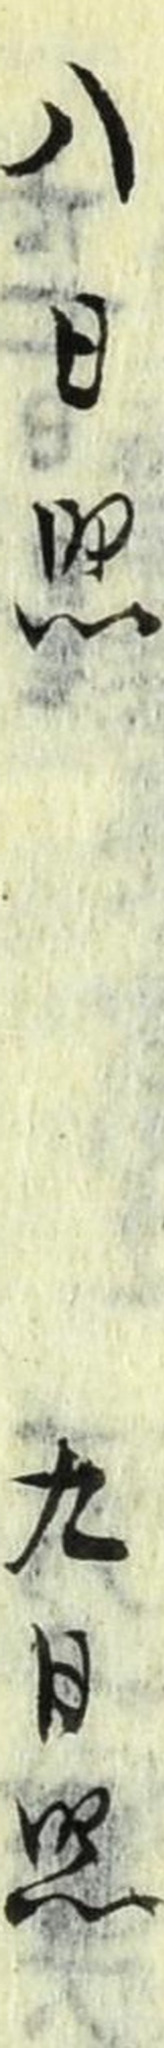八日照九日照
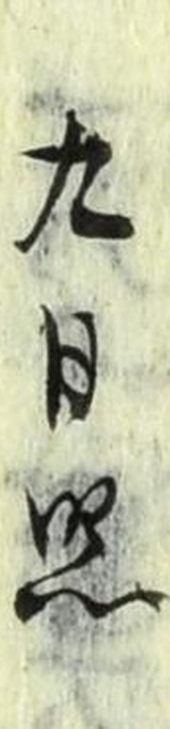四日照
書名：（日記）
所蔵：福井県文書館 Fukui Prefectural Archives
